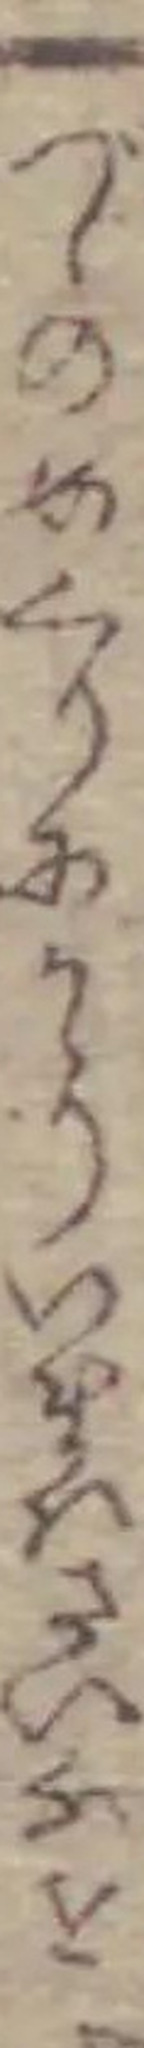づゝのめくりにかゝりいまはさいふを
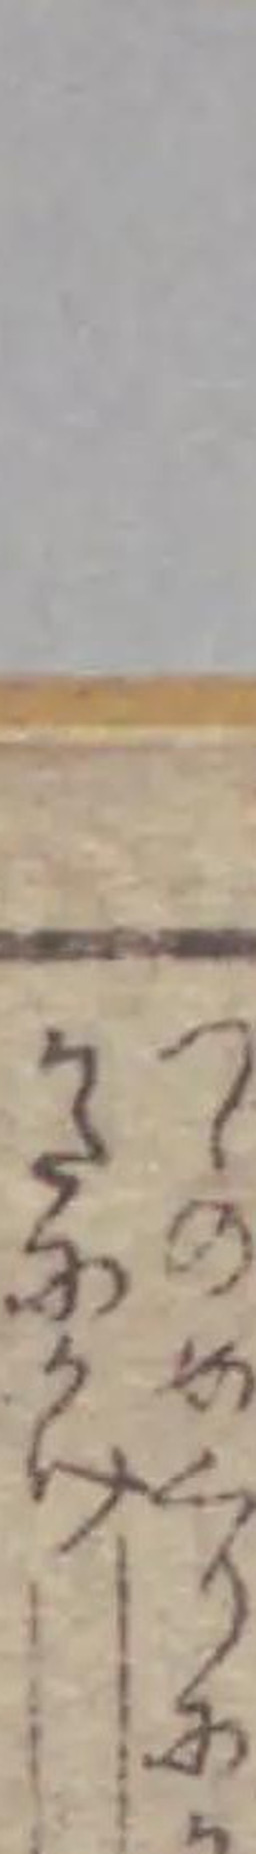かたにかけ
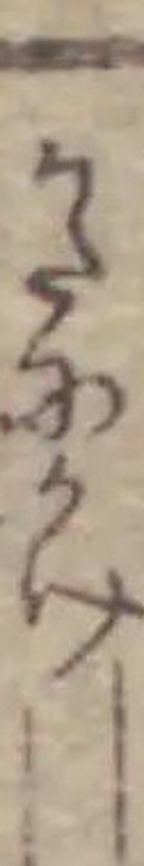かたにかけ
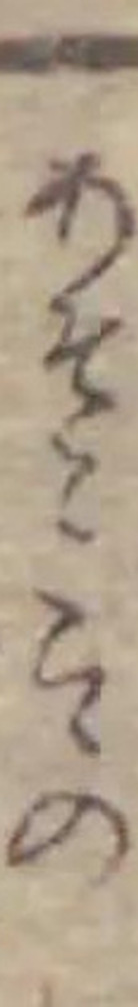あそここゝの
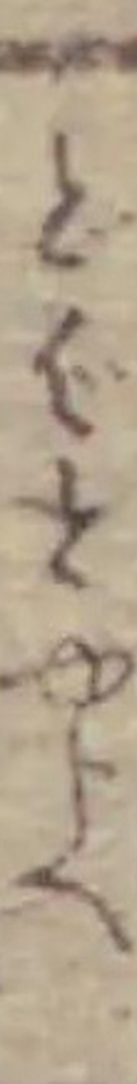とばとやらへ
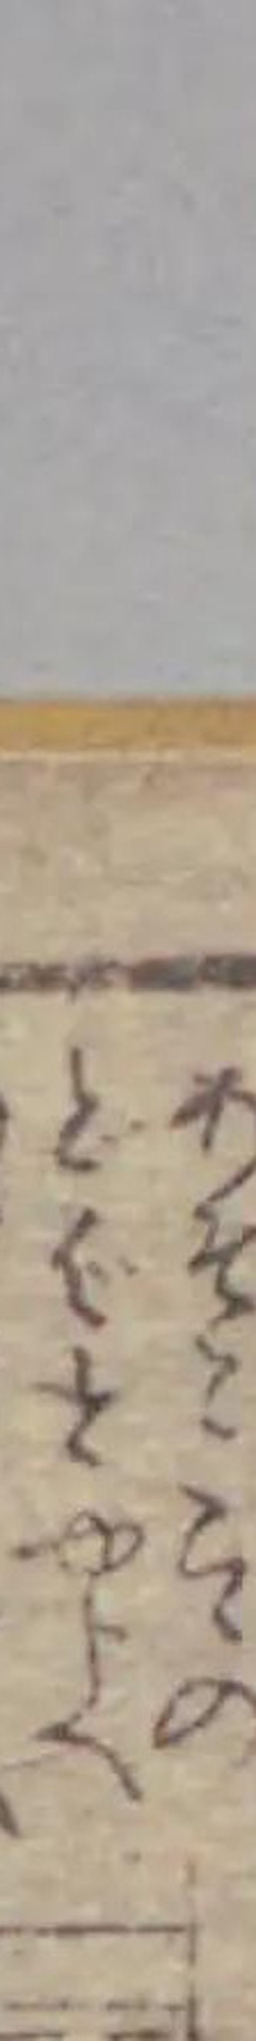とばとやらへ
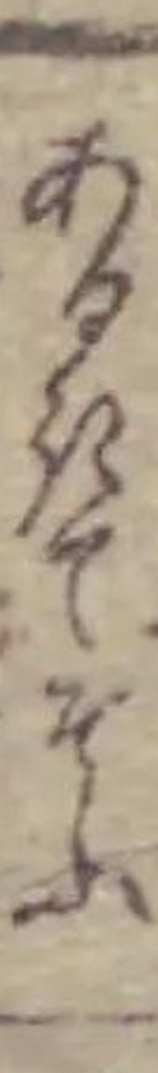あるきてそふ
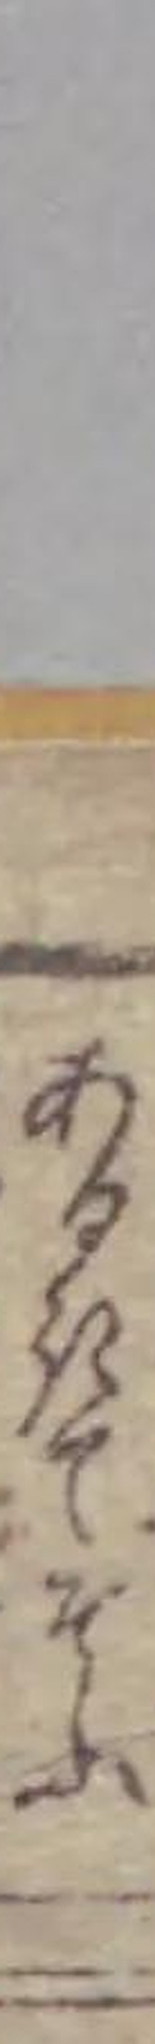あるきてそふ
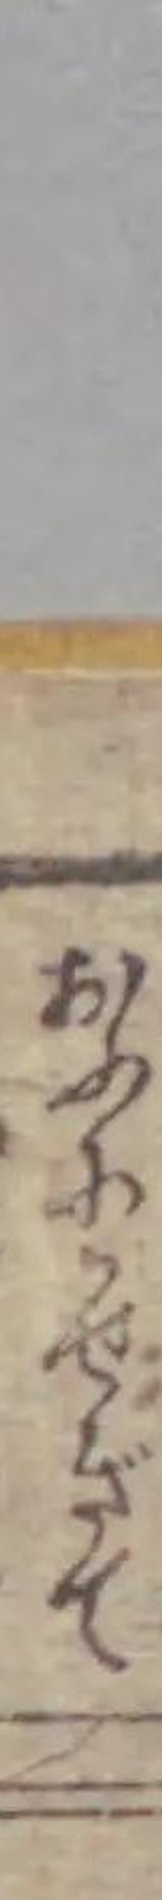おふにかせぎて
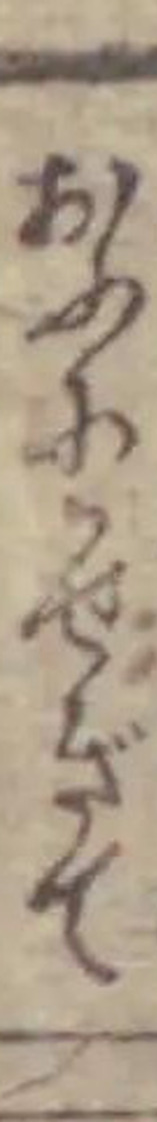おふにかせぎて
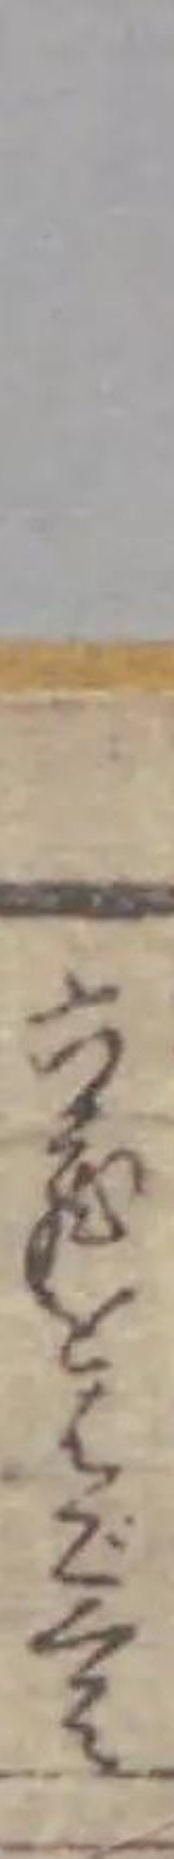六蔵をはごくみ
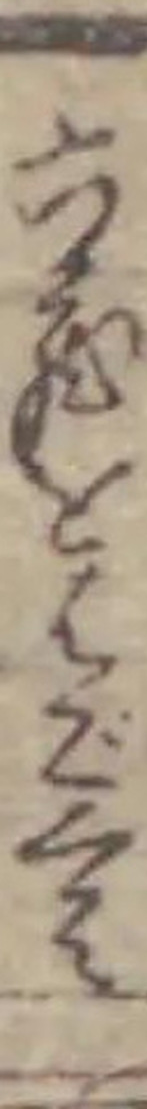六蔵をはごくみ
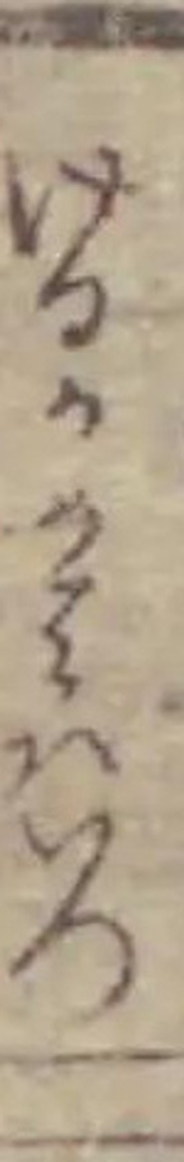けるかかみはいつ
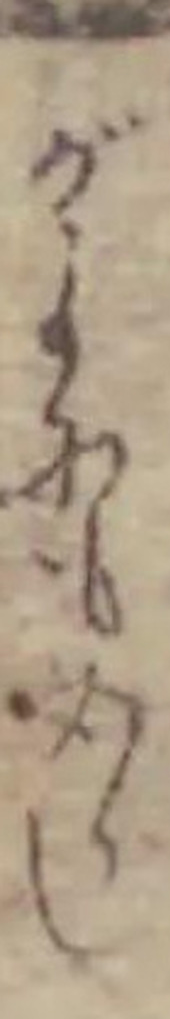がよにも女らし
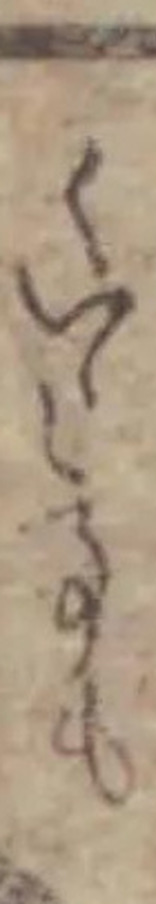くいゝし事も
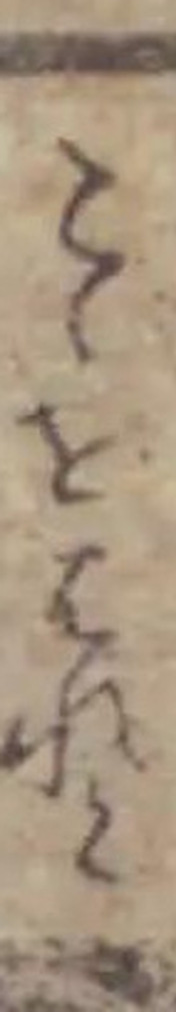こゝをはれと
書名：飛た間違矢口噂 2巻
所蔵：国立国会図書館 National Diet Library, JAPAN
